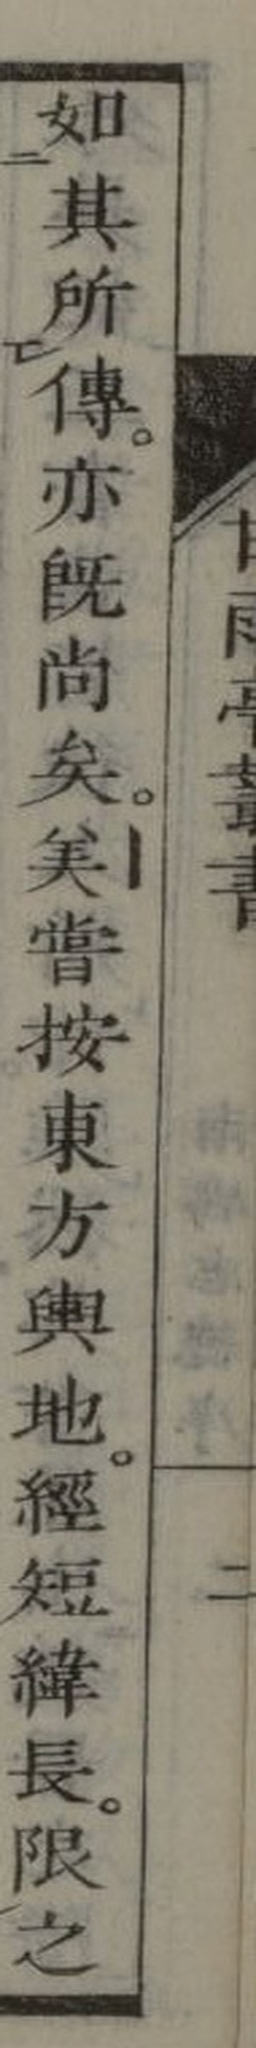如其所傳。亦既尚矣。美嘗按東方輿地。經短緯長。限之
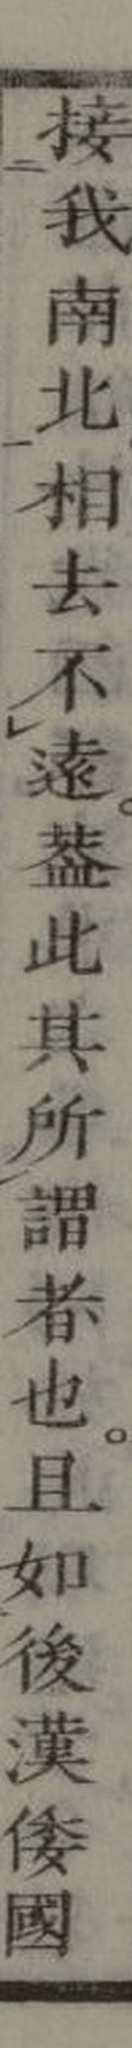接我南北。相去不逺。葢此其所謂者也。且如後漢倭國
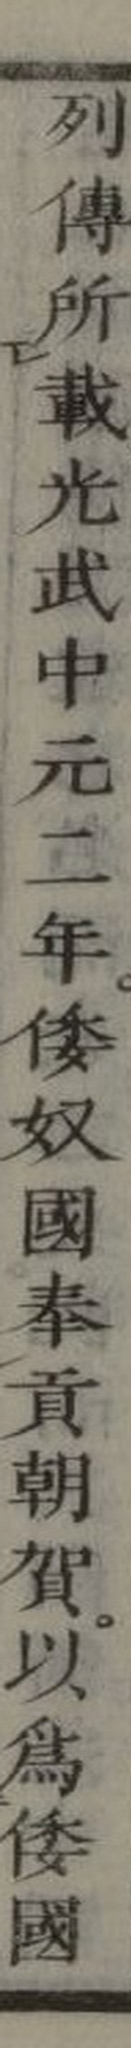列傳所載。光武中元二年。倭奴國奉貢朝賀。以爲倭國
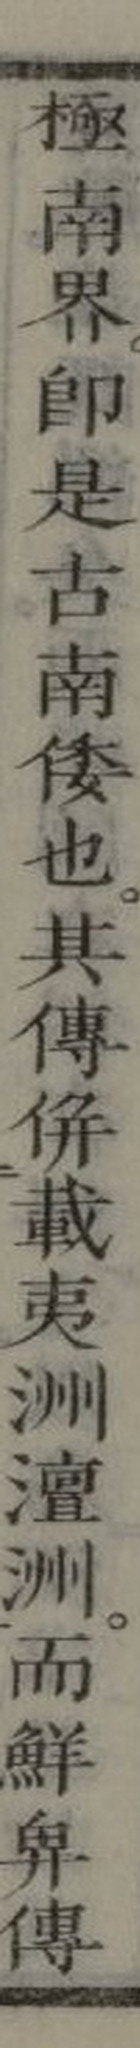極南界。卽是古南倭也。其傳併載夷洲澶洲。而鮮卑傳
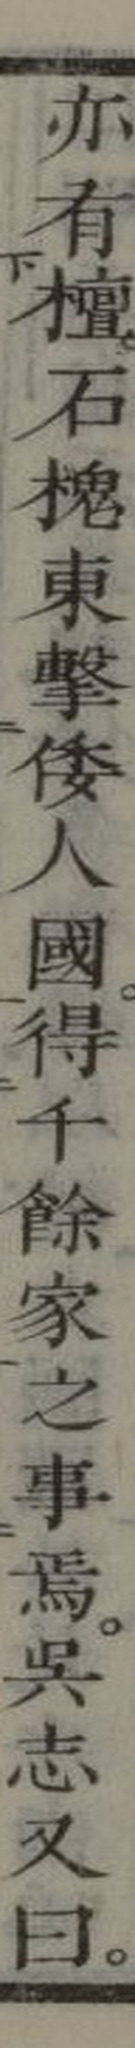亦有檀石槐東撃倭人國。得千餘家之事焉。呉志又曰。
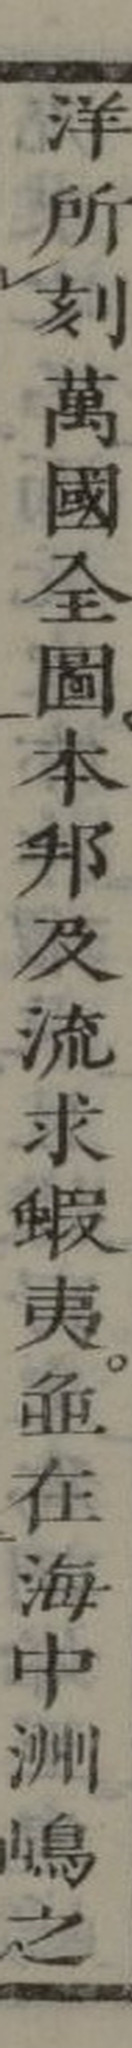洋所刻萬國全圖。本邦及流求蝦夷。並在海中洲嶋之
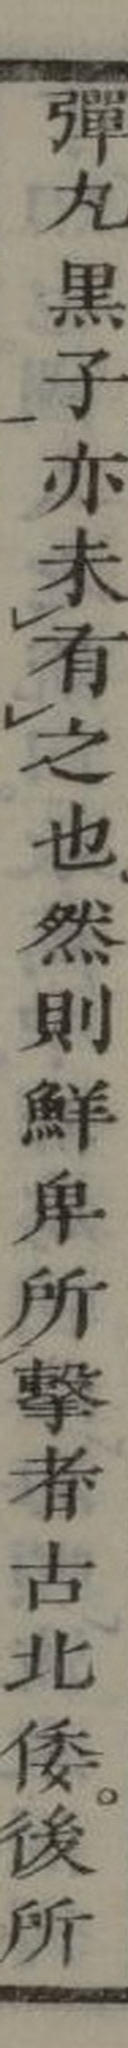彈丸黒子。亦未有之也。然則鮮卑所撃者古北倭。後所
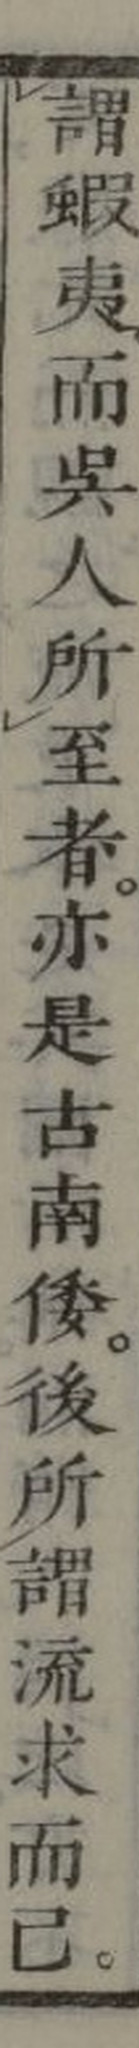謂蝦夷。而呉人所至者。亦是古南倭。後所謂流求而已。
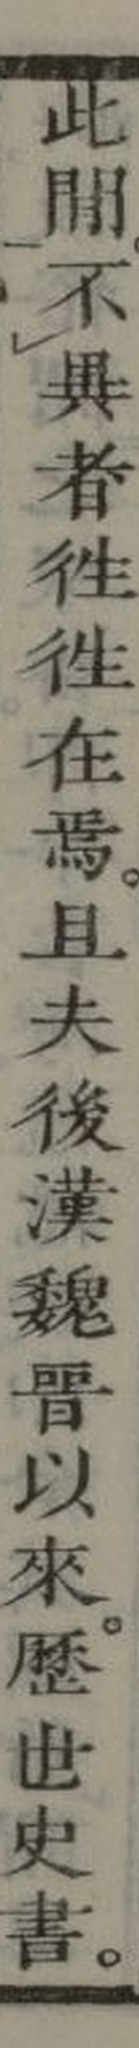此閒。不異者徃徃在焉。且夫後漢魏晉以來。歷世史書。
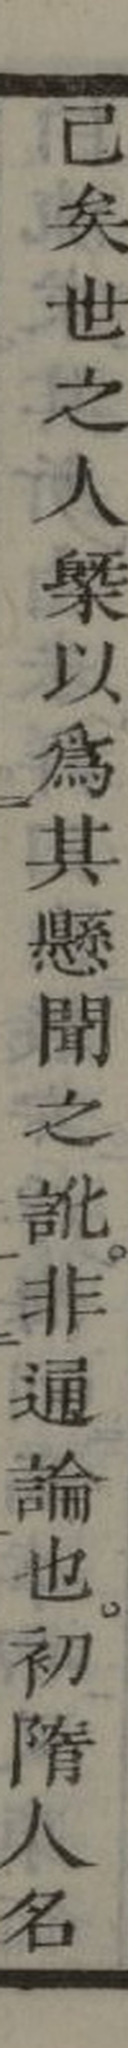已矣。世之人。槩以爲其懸聞之訛。非通論也。初隋人名

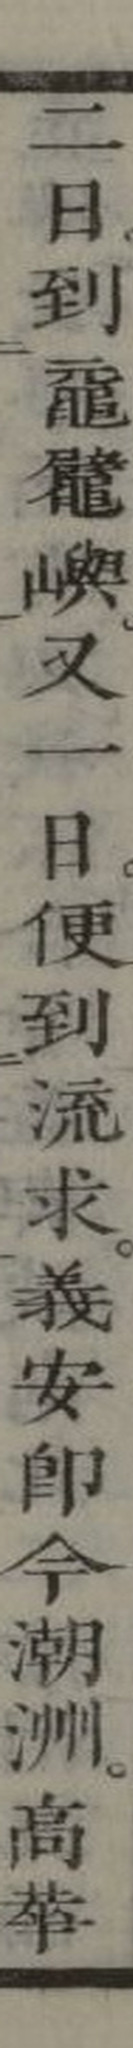二日。到黿鼊嶼。又一日。便到流求。義安卽今潮洲。高蕐
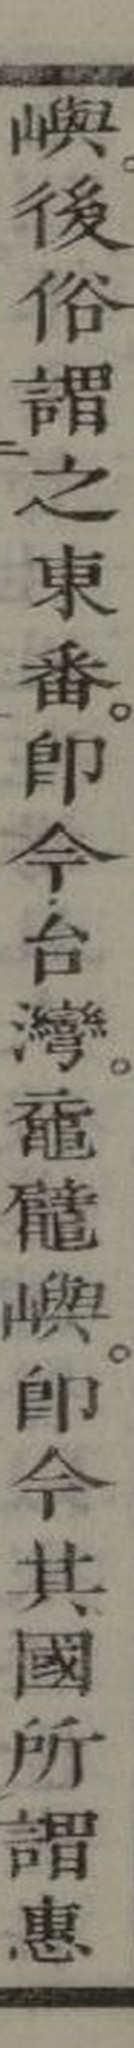嶼。後俗謂之東番。卽今台灣。黿鼊嶼。卽今其國所謂惠
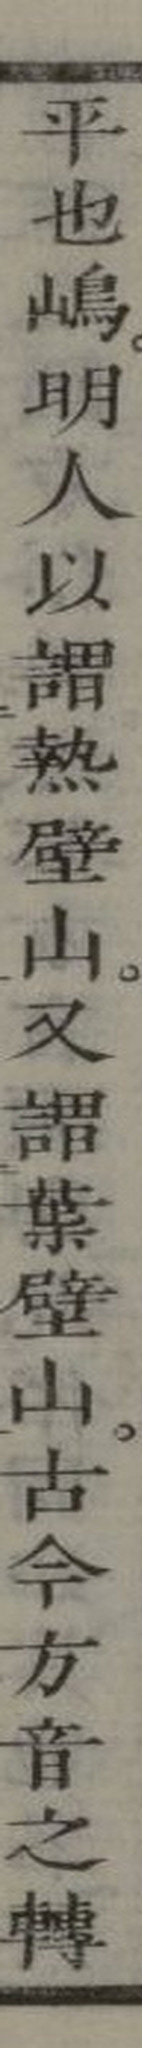平也嶋。明人以謂𤍠壁山。又謂葉壁山。古今方音之轉
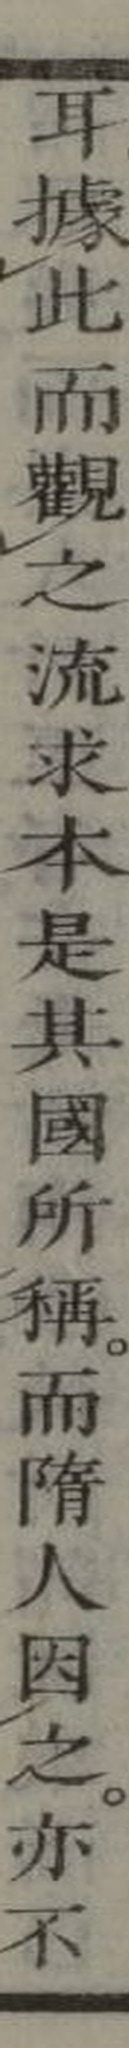耳。據此而觀之。流求本是其國所稱。而隋人因之。亦不
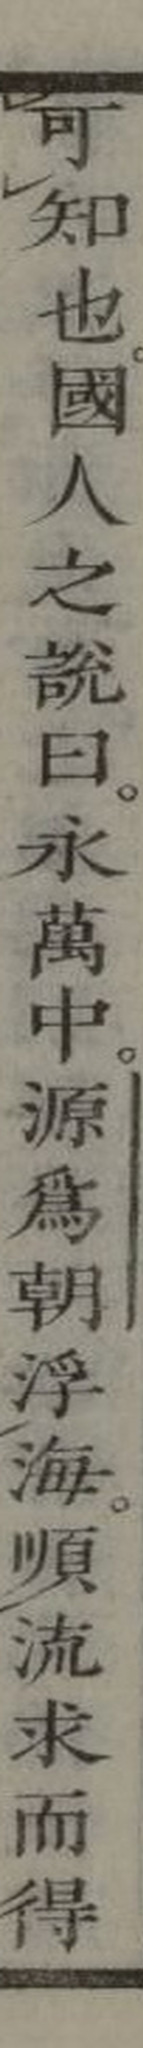可知也。國人之說曰。永萬中。源爲朝浮海。順流求而得
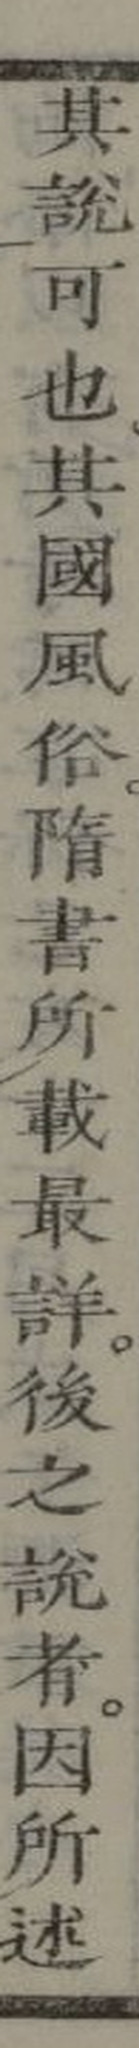其說可也。其國風俗。隋書所載最詳。後之說者。因所述
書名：南島志 呂
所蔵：University of the Ryukyus Library
